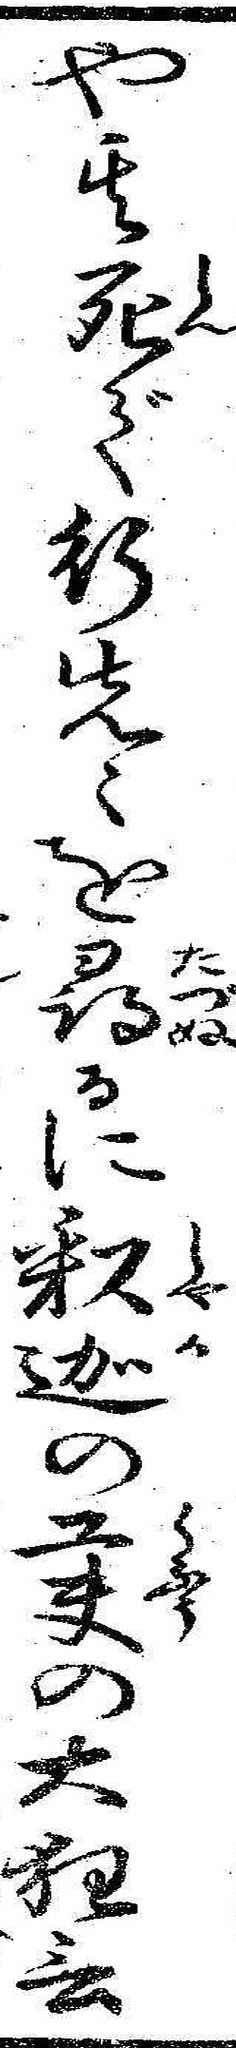や其死で行先々を尋るに釈迦の工夫の大狂言
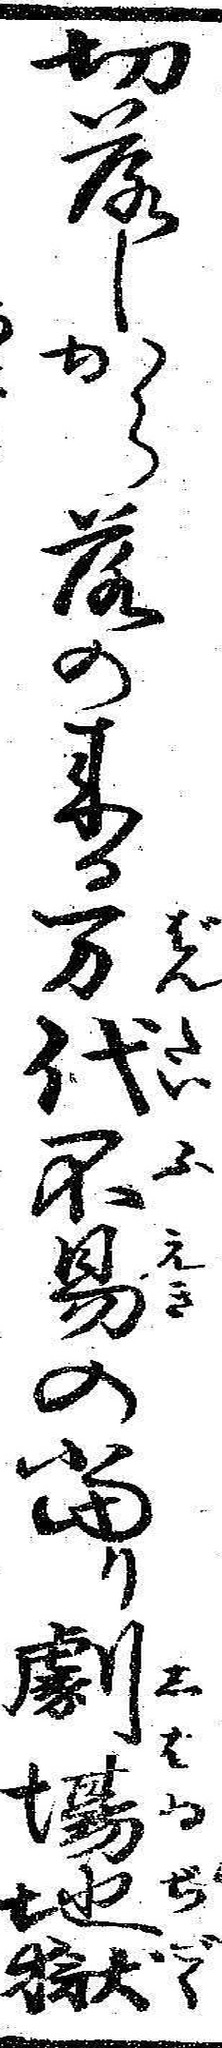切落しから落の来る万代不易の当り劇場地獄
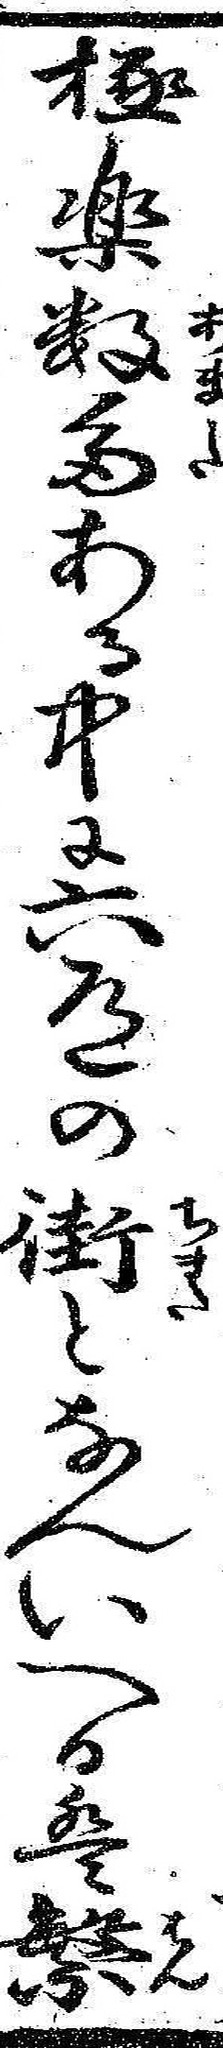極楽数多ある中に六道の街となんいへるは繁
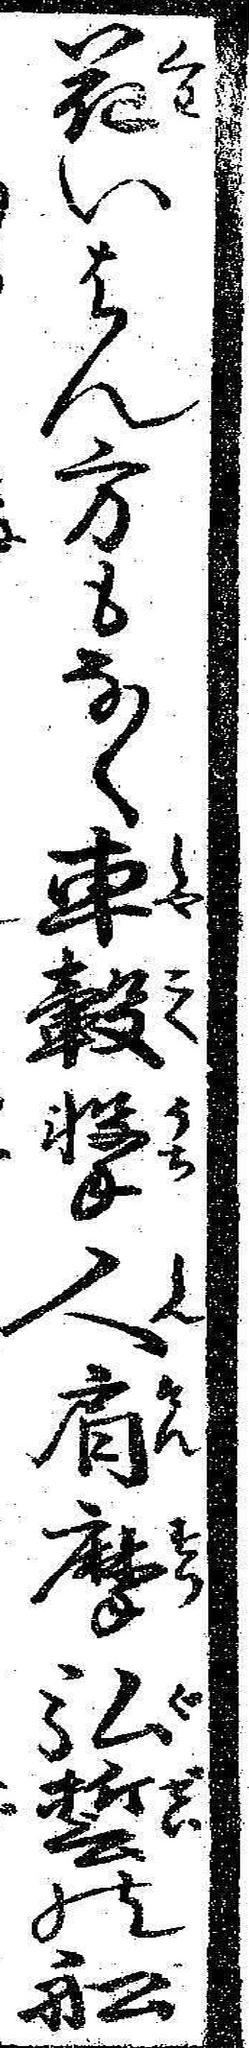花いはん方もなく車穀撃人肩摩弘誓の船
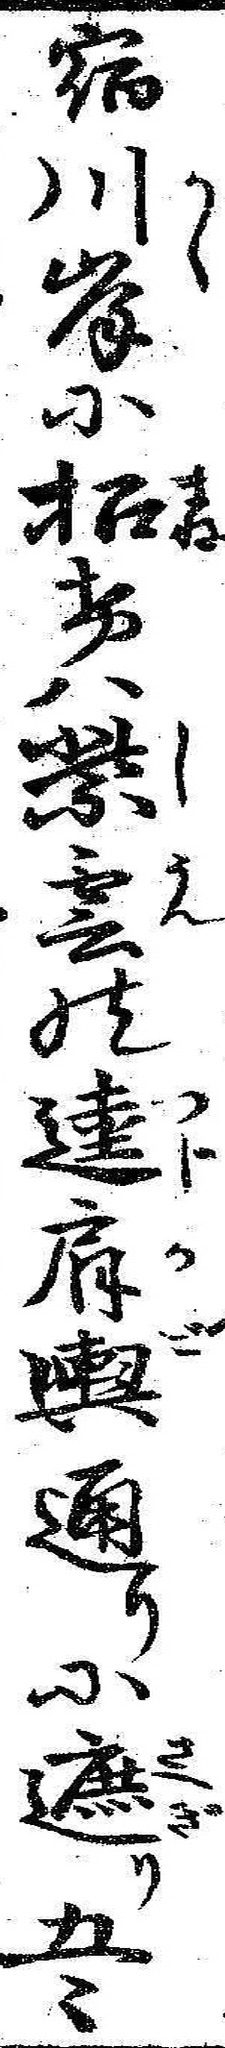宿川岸に招けは紫雲の逵肩輿通遮五々
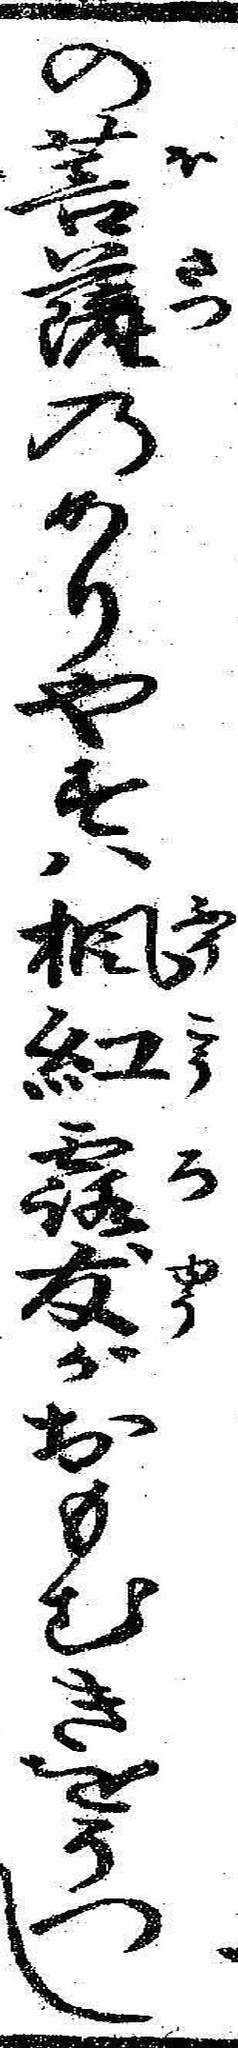の菩薩のめりやすは楓紅露友がおもむきをうつし
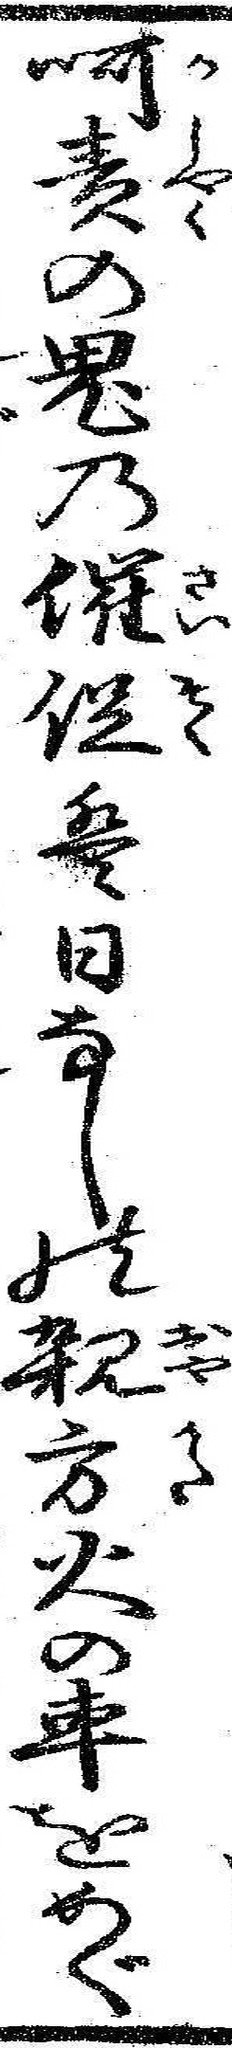呵責の鬼の催但は日なしの親方火の車をめぐ
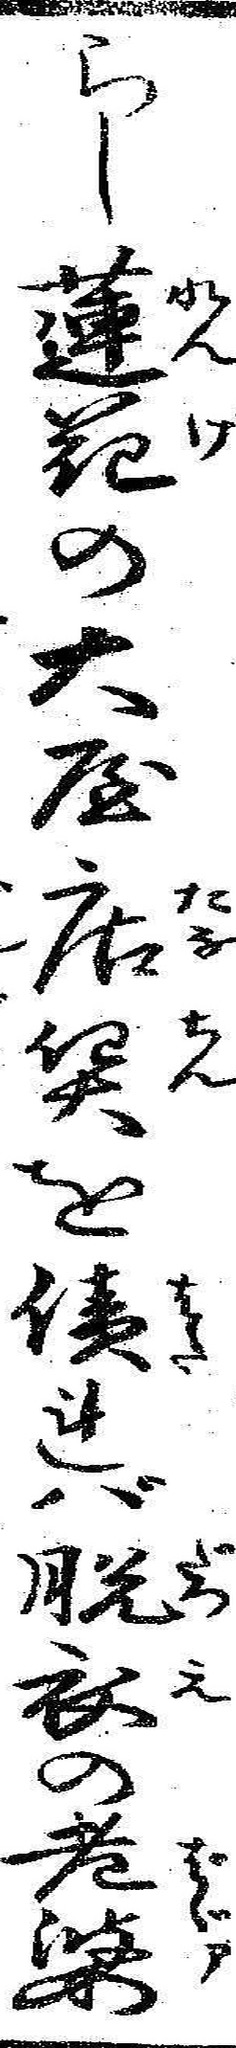らし蓮花の大屋店賃を債れば脱衣の老婆
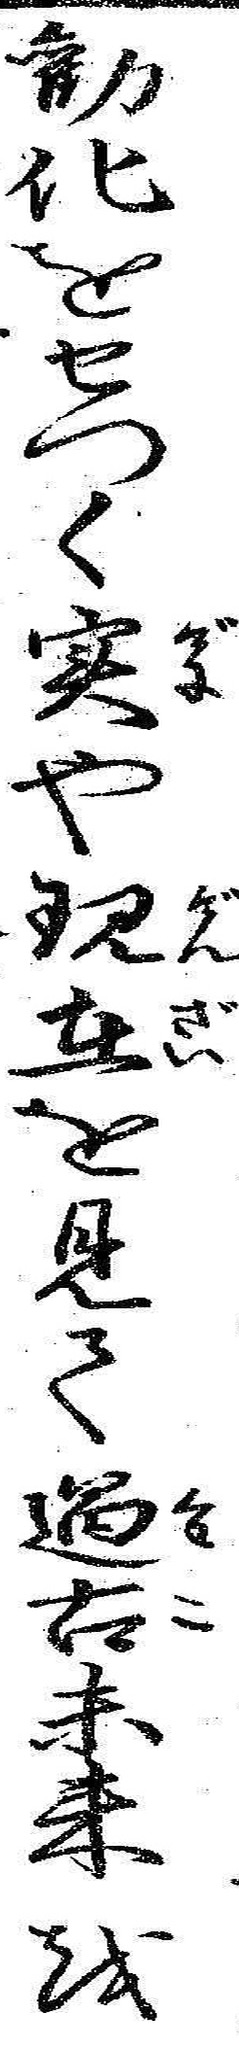勧化をせつく実や現在を見て過古未来を
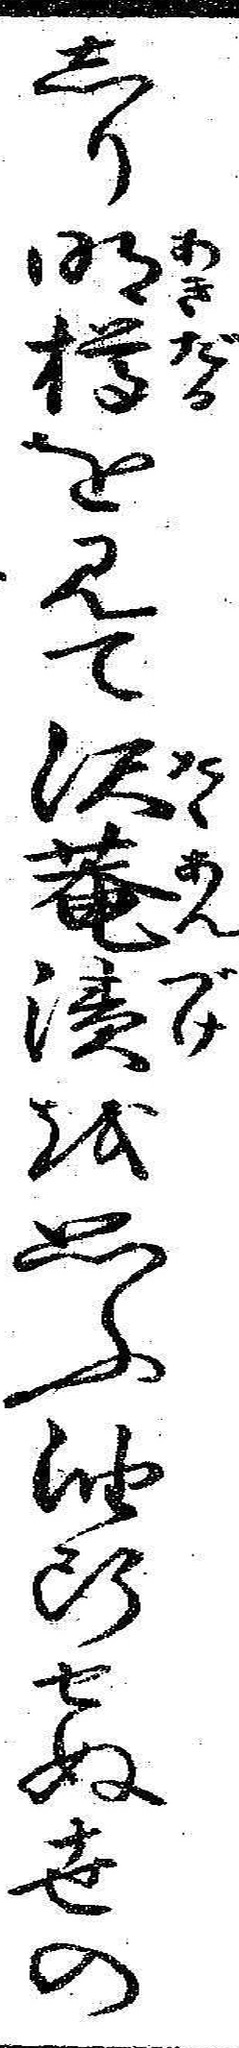しり明樽を見て沢庵漬を思ふ油断せぬ世の
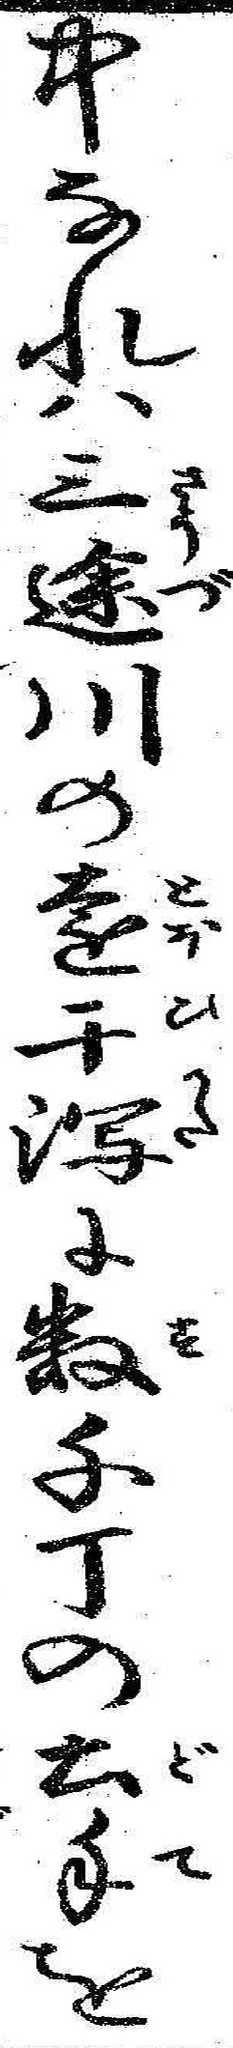中なれは三途川の遠干潟に数千丁の土手を
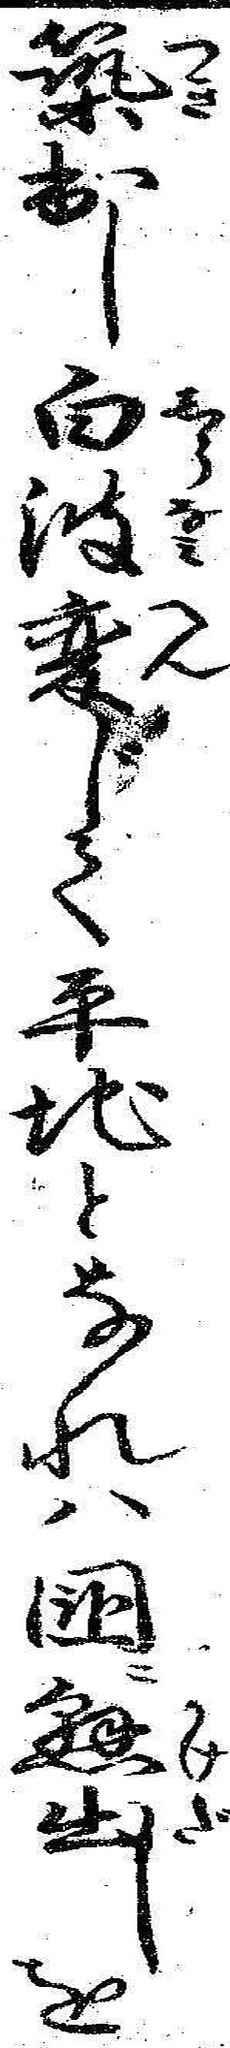築出し白波変じて平地となれは国に懸出しを
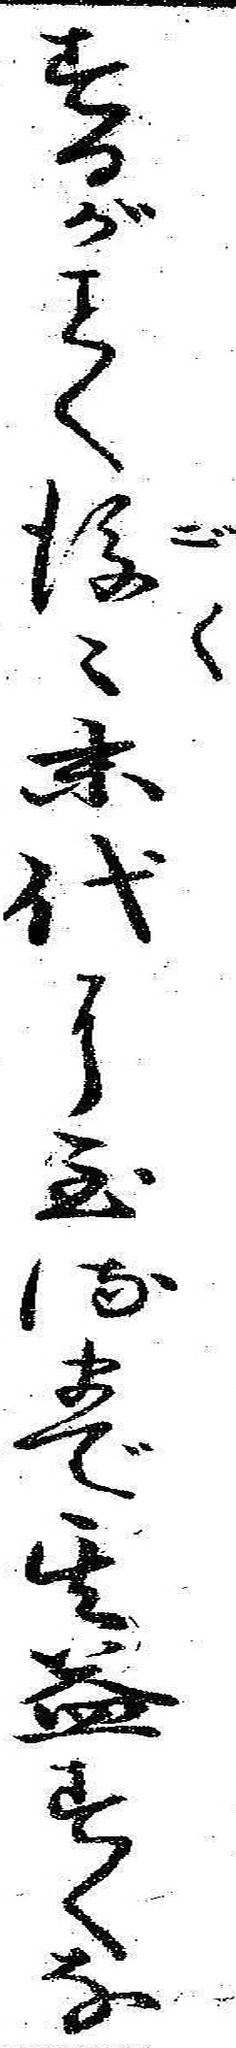するがことく後々末代に至るまで其益すくな

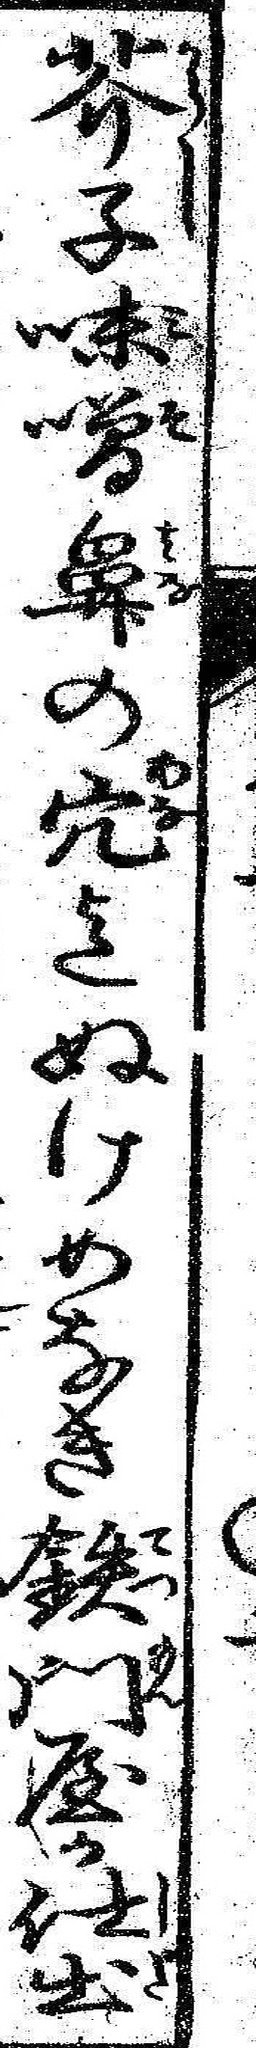芥子味噌鼻の穴迄ぬけめなき鉄門屋か仕出
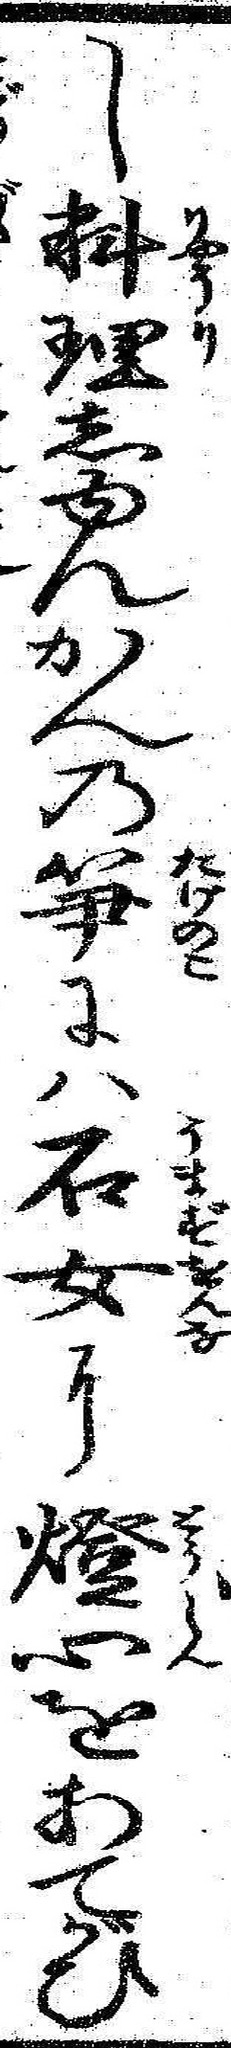し料理しゆんかへの筍には石女に燈心をあてがひ
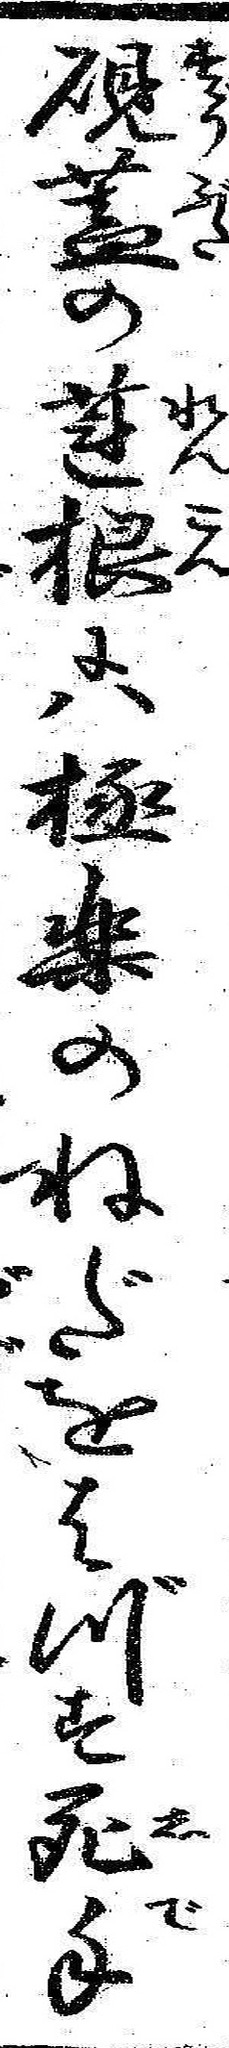硯蓋の蓮根には極楽のねだをはづす死手
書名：根無草後編
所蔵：国文学研究資料館
